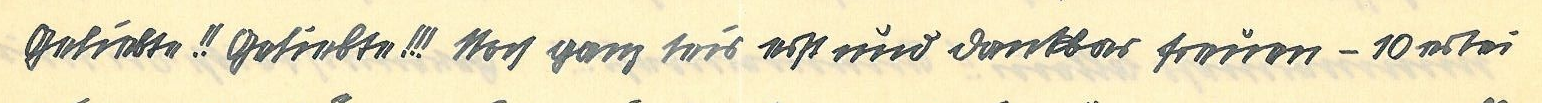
Geliebte!! Geliebte!!! Noch ganz leis erst und dankbar freuen – 10erlei
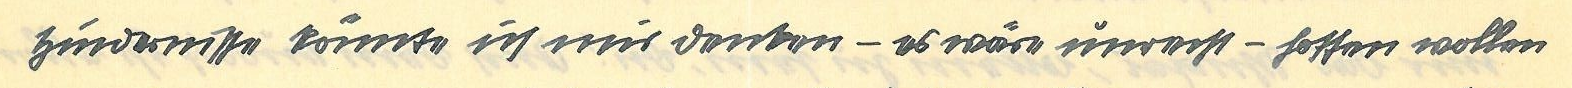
Hindernisse könnte ich mir denken – es wäre unrecht – hoffen wollen
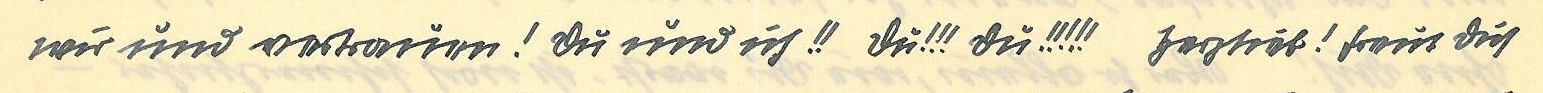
wir und vertrauen! Du und ich!! Du!!! Du!!!!! Herzlieb! Freut Dich
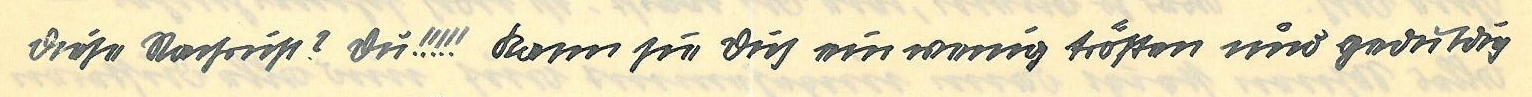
diese Nachricht? Du!!!!! Kann sie Dich ein wenig trösten und geduldig
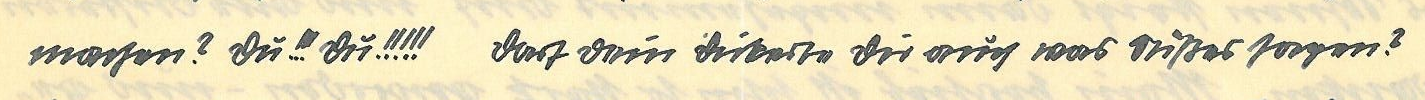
machen? Du!!! Du!!!!! Darf Dein Dickerle Dir auch was Süßes sagen?
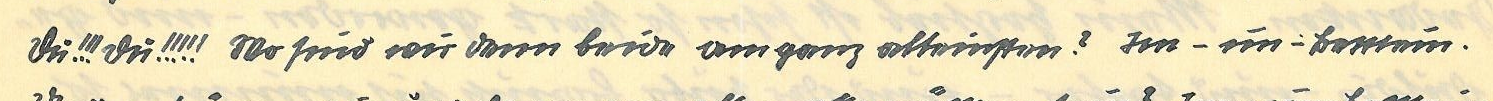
Du!!! Du!!!!! Wo sind wir denn beide am ganz alleinsten? Im – im – Bettlein.
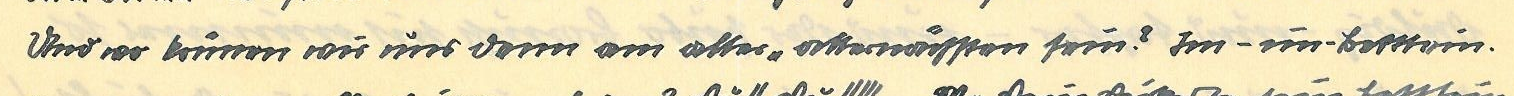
Und wo können wir uns dann am aller-allernächsten sein? Im – im – Bettlein.
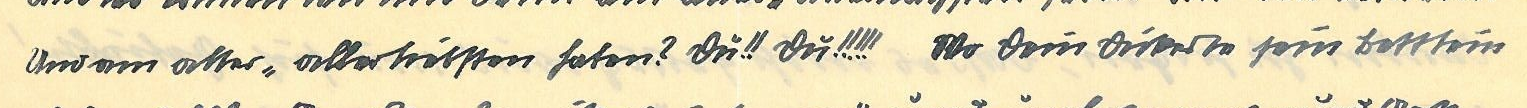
Und am aller-allerliebsten haben? Du!! Du!!!!! Wo Dein Dickerle sein Bettlein
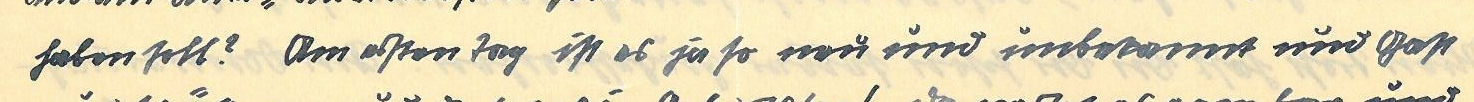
haben soll? Am ersten Tag ist es ja so neu und unbekannt und Gast
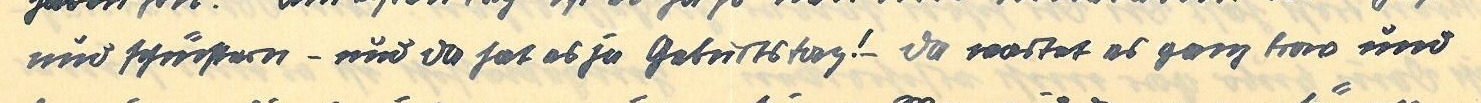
und schüchtern – und da hat es ja Geburtstag! – Da wartet es ganz brav und
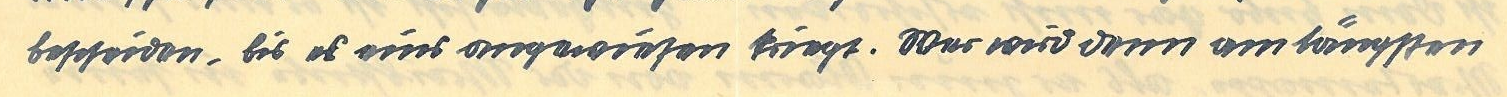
bescheiden, bis es eines angewiesen kriegt. Wer wird dann am längsten
